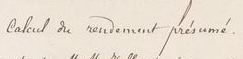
Calcul du rendement présumé.
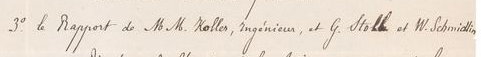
3o le Rapport de MM. Koller, Ingénieur, et G. Stoll et W. Schmidlin,
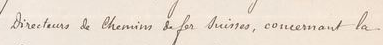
Directeurs de Chemins de fer Suisses, concernant la
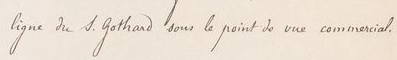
ligne du S. Gothard sous le point de vue commercial.
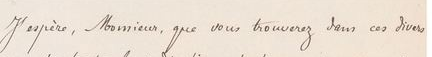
J'espère, Monsieur, que vous trouverez dans ces divers
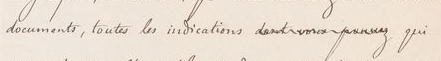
documents, toutes les indications dont vous pouvez qui
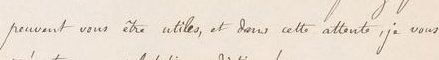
peuvent vous être utiles, et dans cette attente, je vous
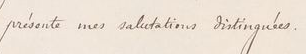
présente mes salutations distinguées.
